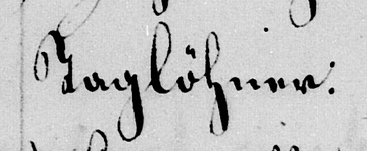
Taglöhner.
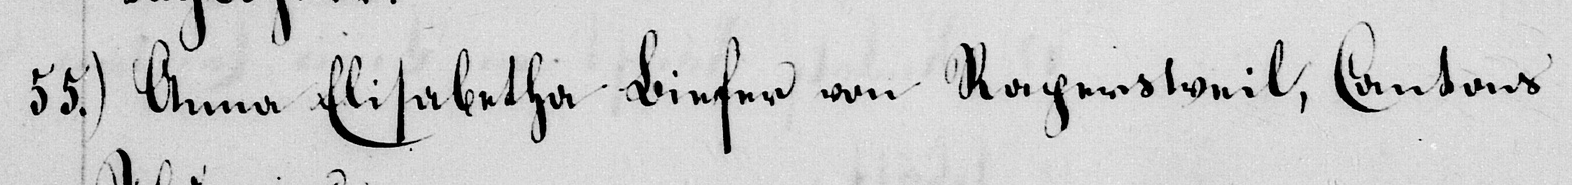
55.) Anna Elisabetha Bieser von Raperschweil, Cantons
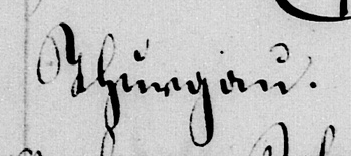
Thurgau.
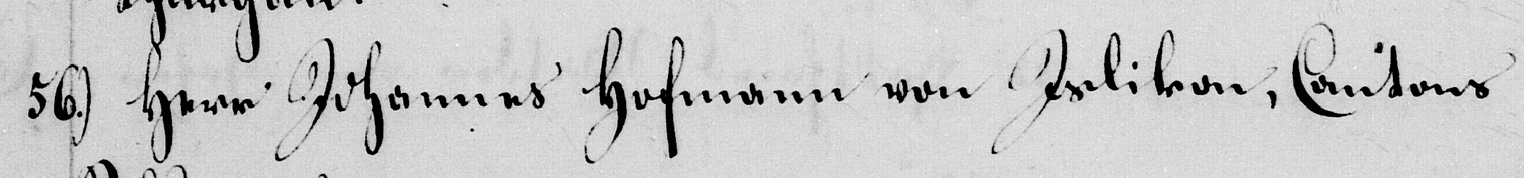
56.) Herr Johannes Hofmann von Islikon, Cantons
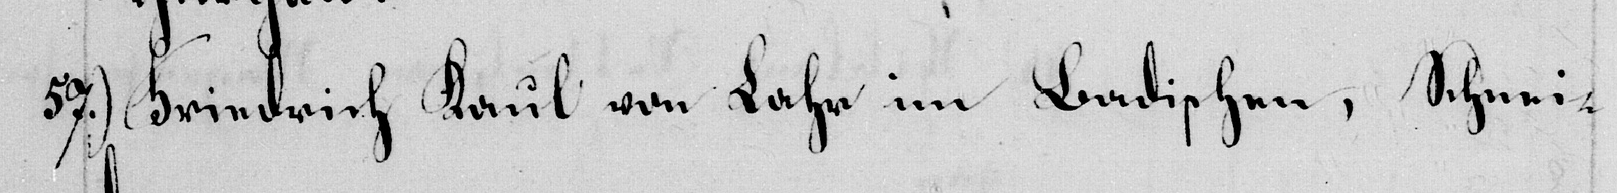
57.) Friedrich Kaul von Lahr im Badischen, Schnei¬
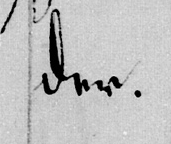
der.
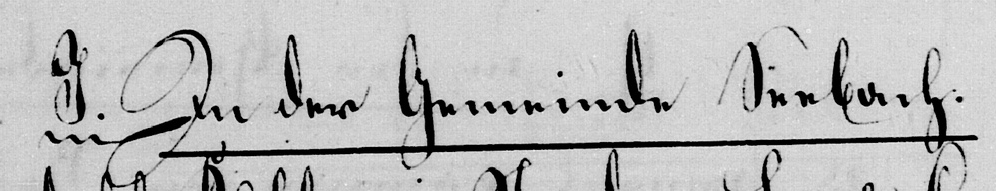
J. In der Gemeinde Seebach.
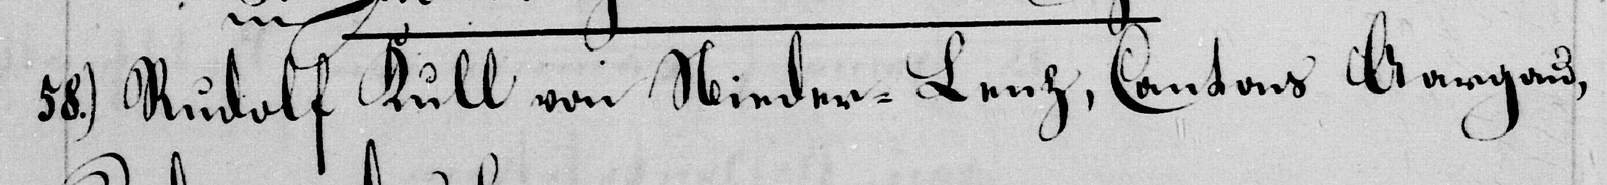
58.) Rudof Kull von Nieder-Lenz, Cantons Aargau,
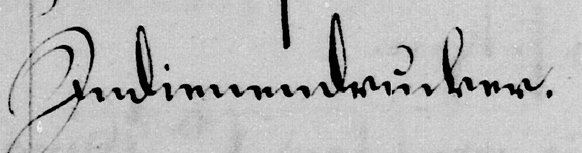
Indienendrucker.
